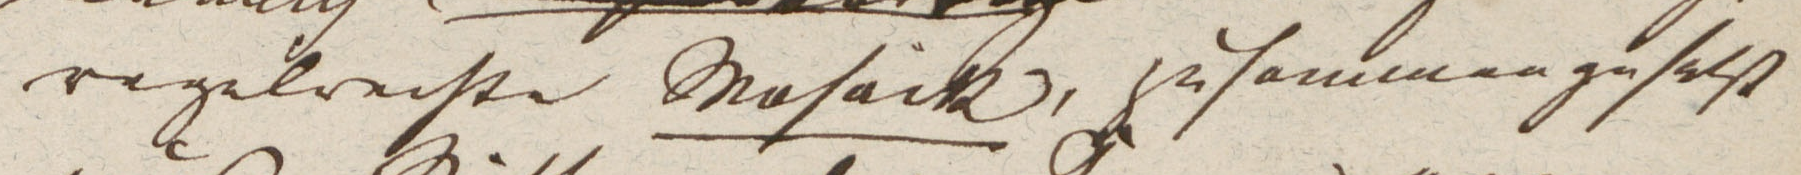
regelrechte Mosaik, zusammengesetzt
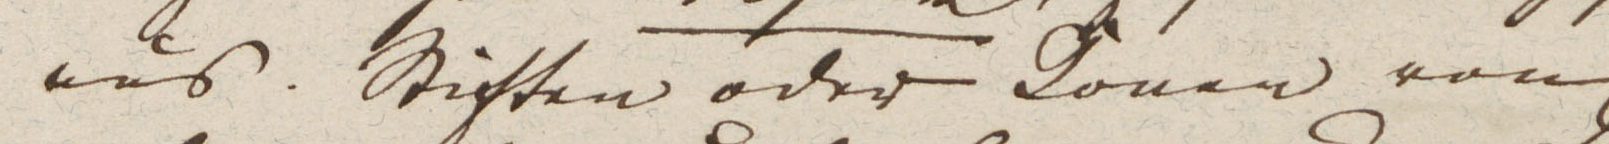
aus Stiften oder Konen von
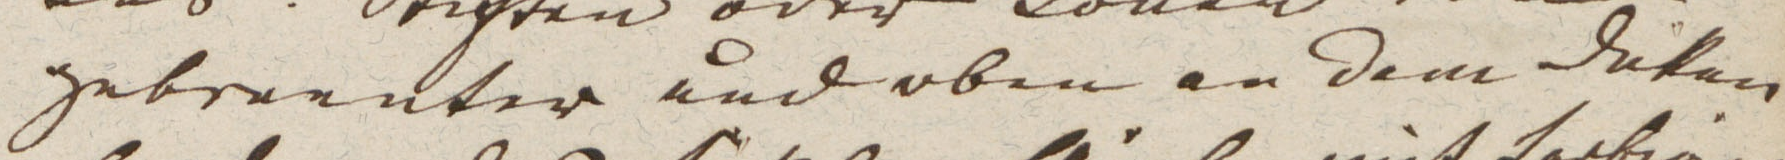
gebrannter und oben an dem dicken
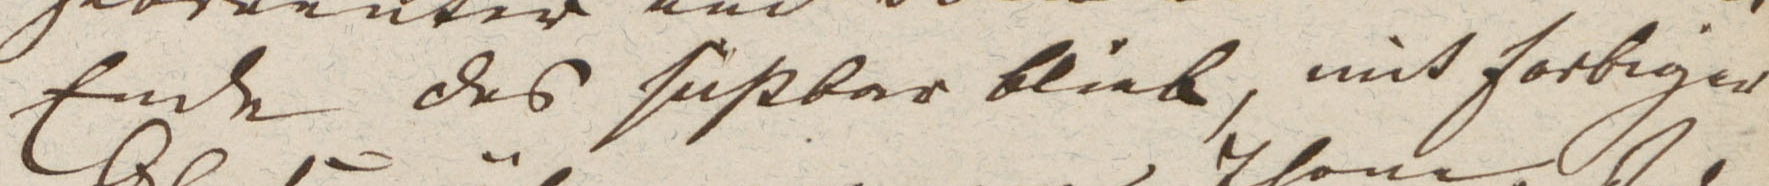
Ende das sichtbar blieb, mit farbiger
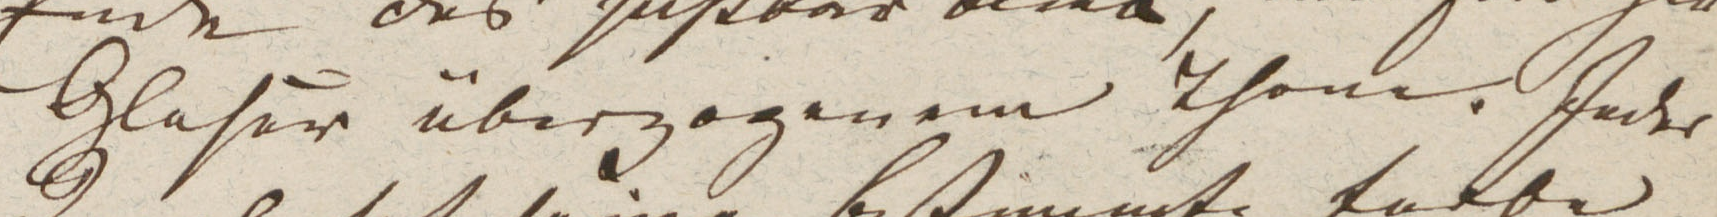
Glasur überzogenem Thone. Jeder
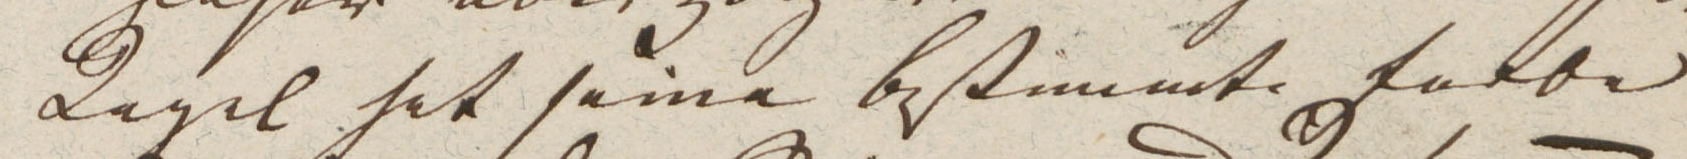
Kegel hat seine bestimmte Farbe
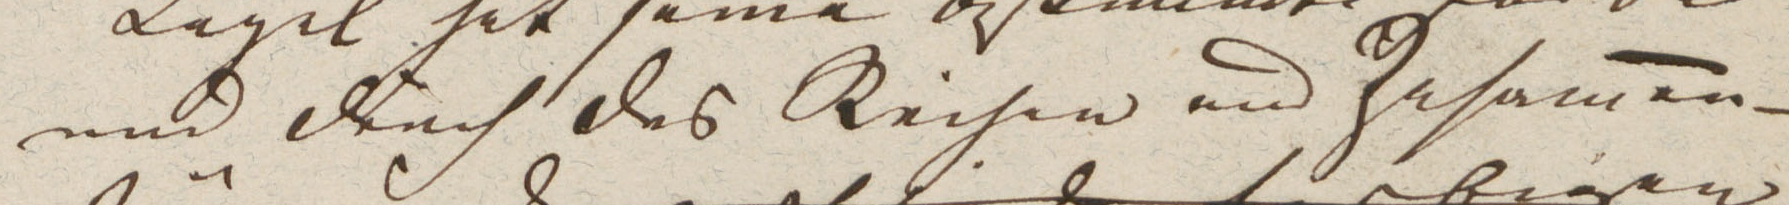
und durch das Reihen und Zusammen-
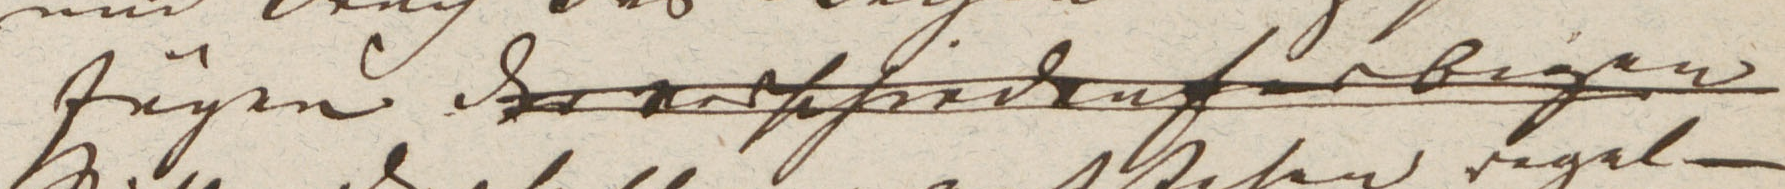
fügen der verschiedenfarbigen
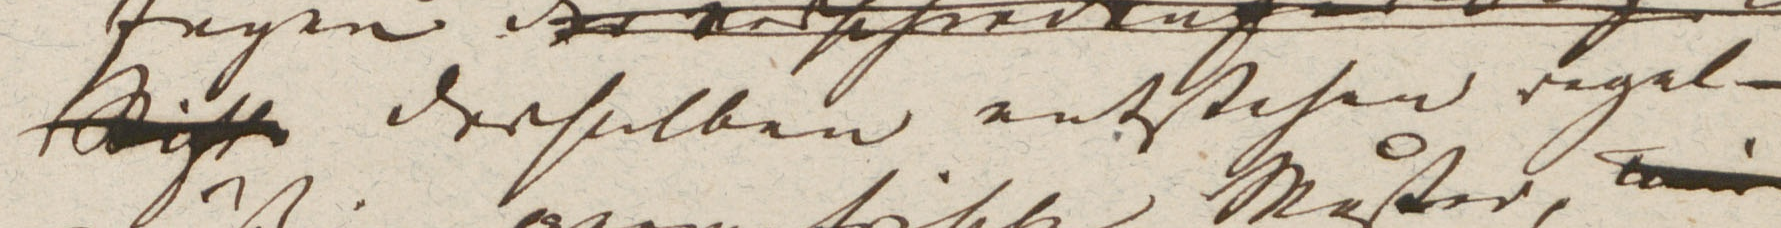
Stift derselben entstehen regel-
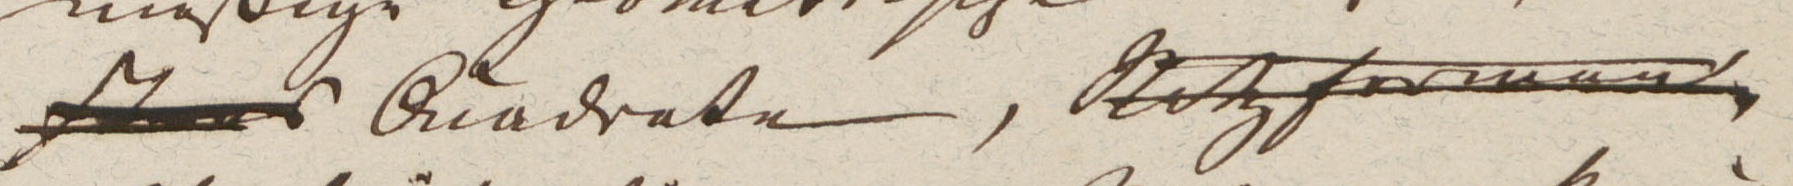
wie stens Quadrate, Netzformen
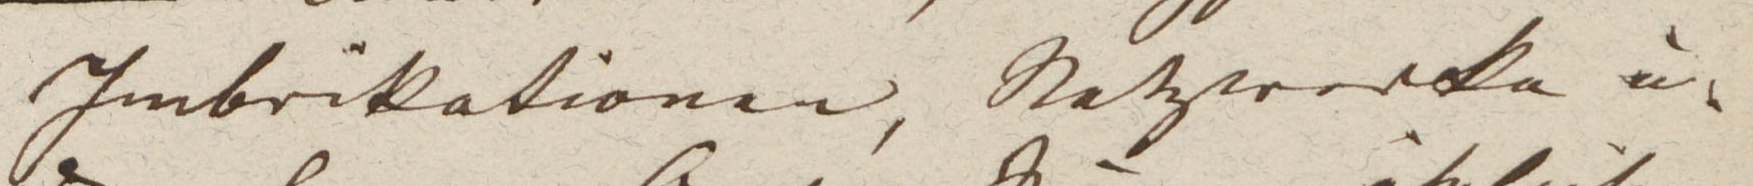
Imbrikationen, Netzwerke u.
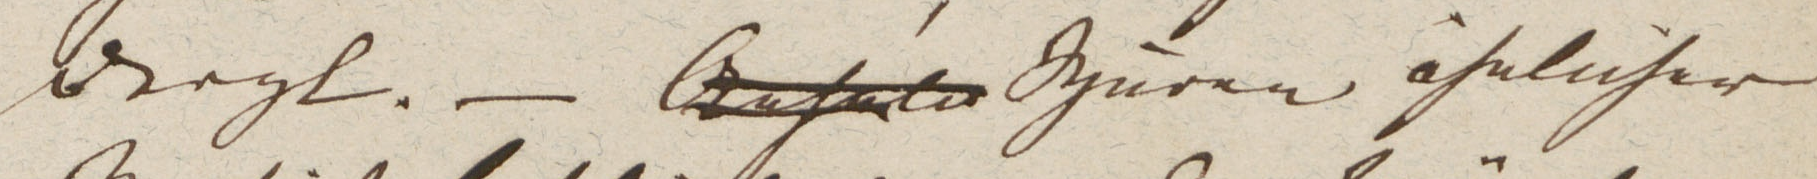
dergl. – Aehnli Spuren ähnlicher
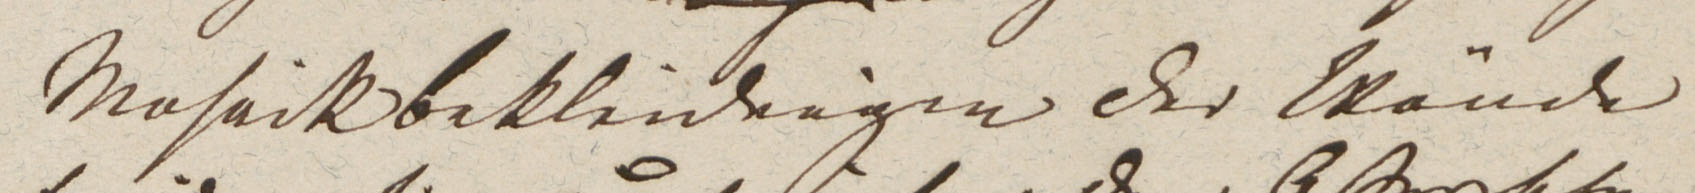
Mosaikbekleidungen der Wände
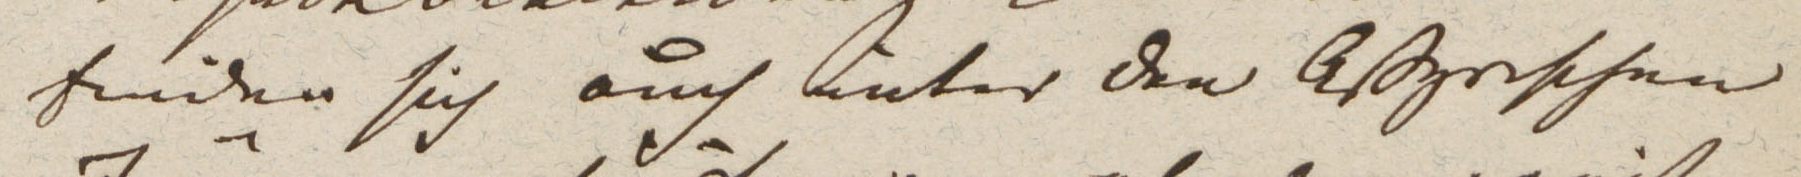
finden sich auch unter den Assyrischen
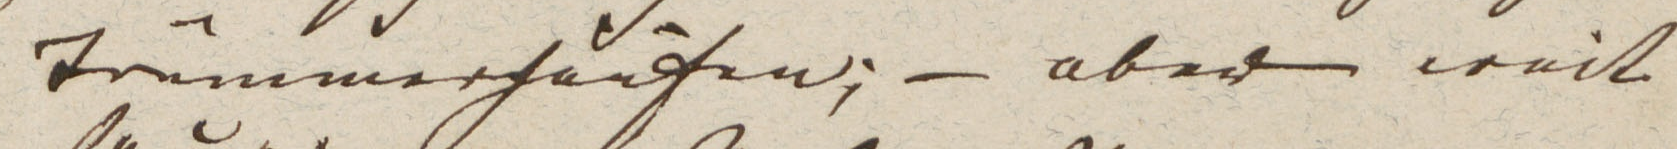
Trümmerhaufen; – aber weit
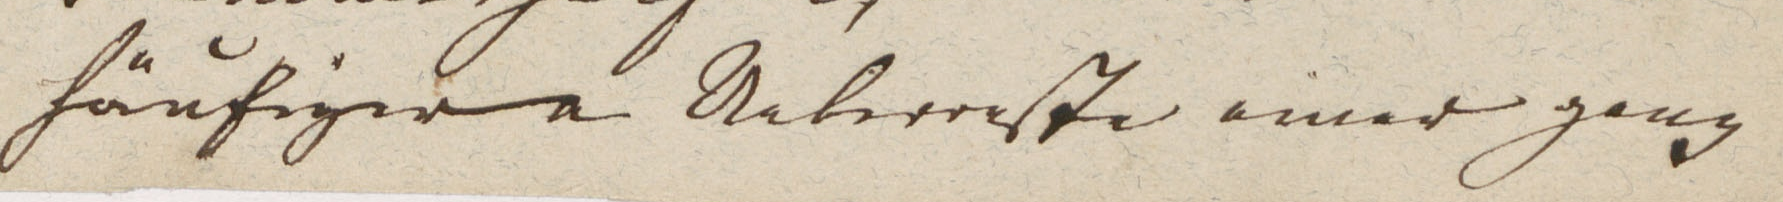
häufigere Ueberreste einer ganz
